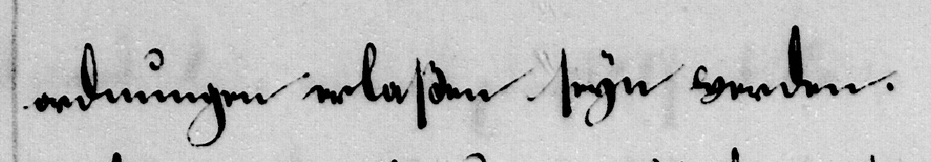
ordnungen erlaßen seyn werden.
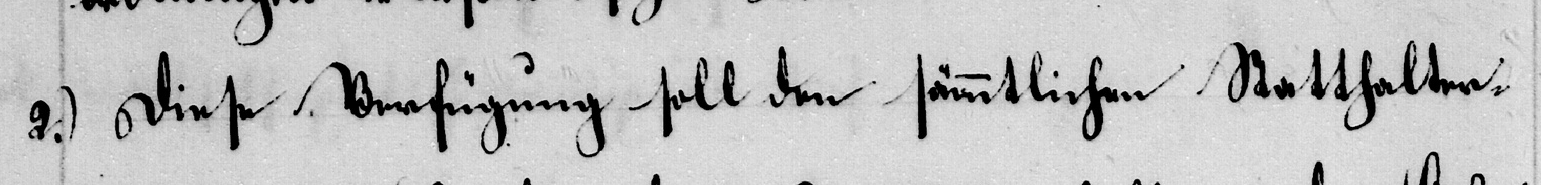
2.) Diese Verfügung soll den sämmtlichen Statthalter¬
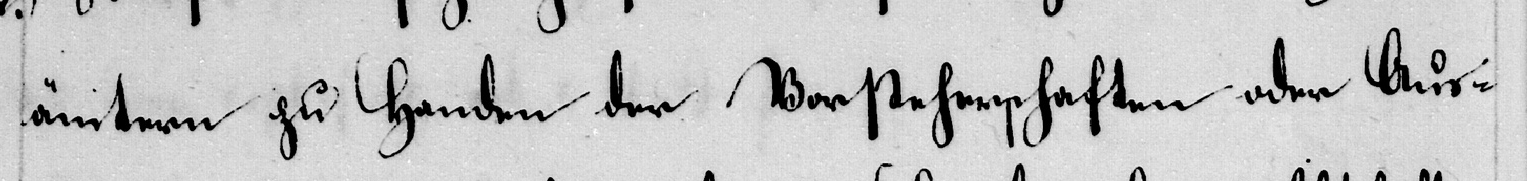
ämtern zu Handen der Vorsteherschaften oder Aus¬
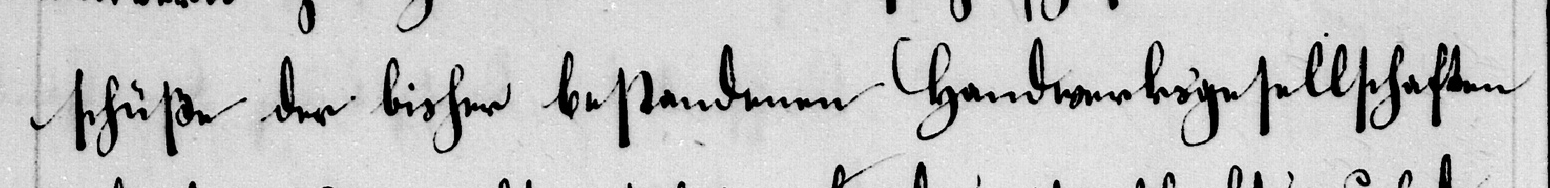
schüße der bisher bestandenen Handwerksgesellschaften
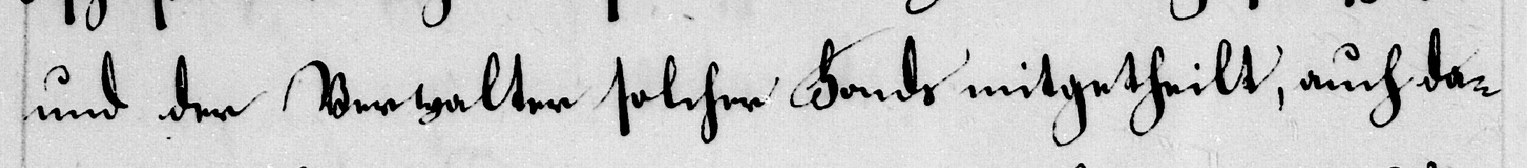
und der Verwalter solcher Fonds mitgetheilt, auch da¬
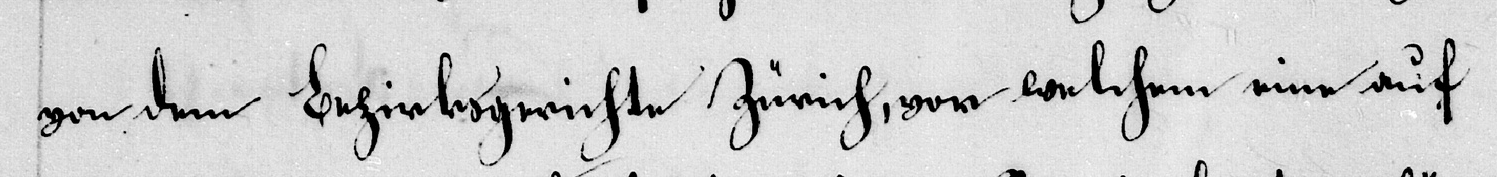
von dem Bezirksgerichte Zürich, von welchem eine auf
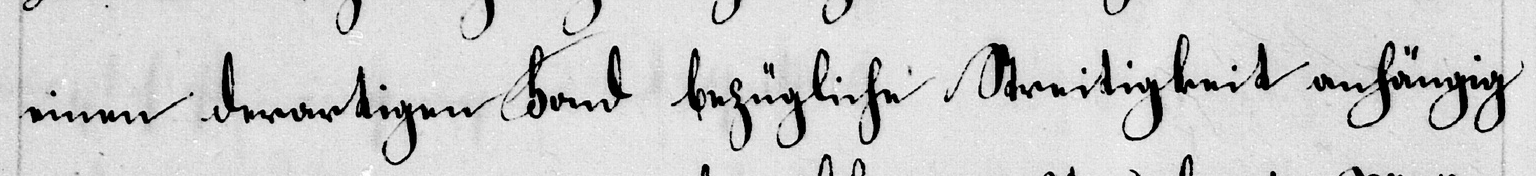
einen derartigen Fond bezügliche Streitigkeit anhängig
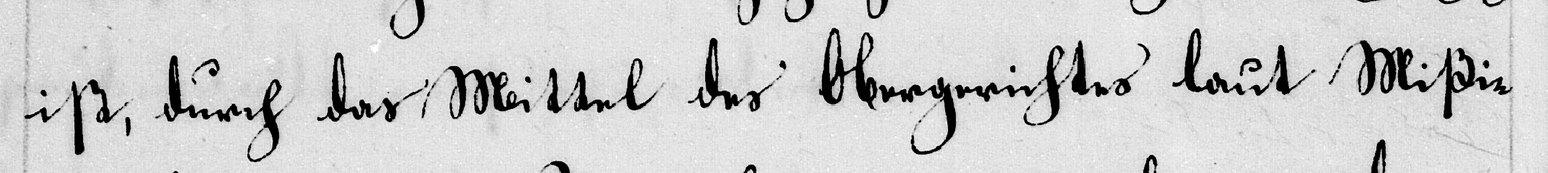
ist, durch das Mittel des Obergerichtes laut Mißi¬
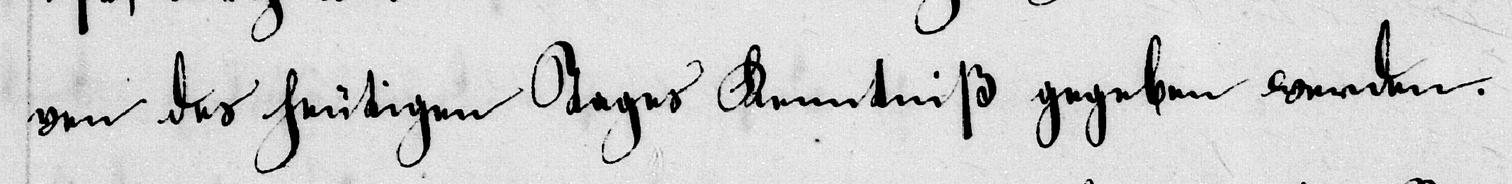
ven des heutigen Tages Kenntniß gegeben werden.
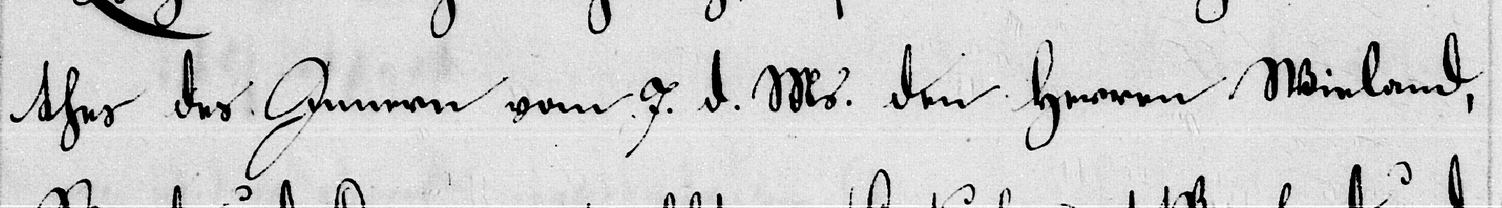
thes des Innern vom 7. d. Ms. den Herren Wieland,
